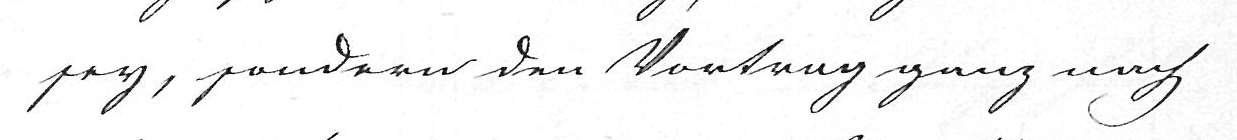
sey, sondern den Vortrag ganz nach
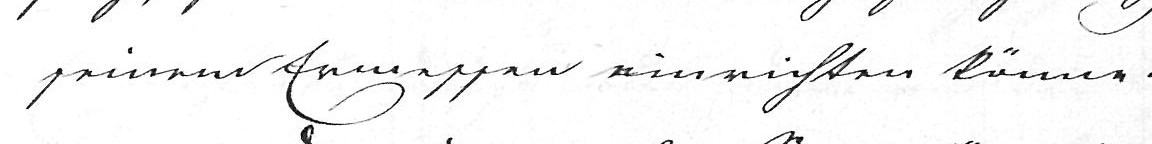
seinem Ermessen einrichten könne.
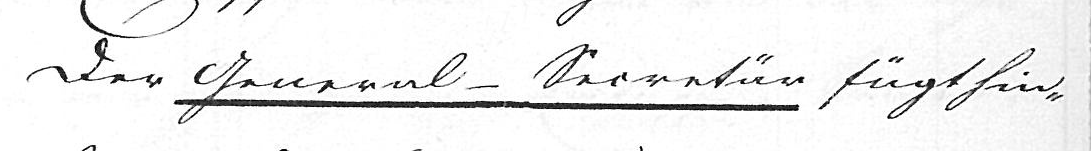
Der General-Secretär fügt hin-
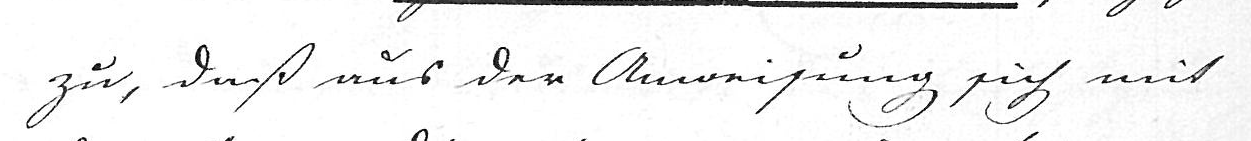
zu, daß aus der Anweisung sich mit
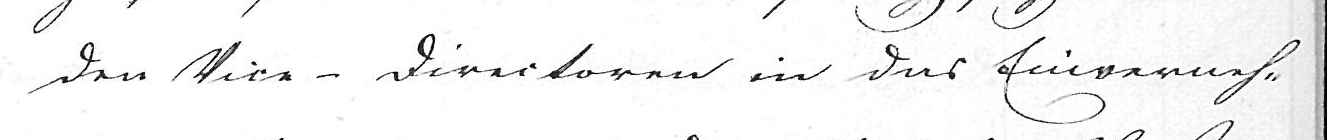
den Vice-Directoren in das Einverneh-
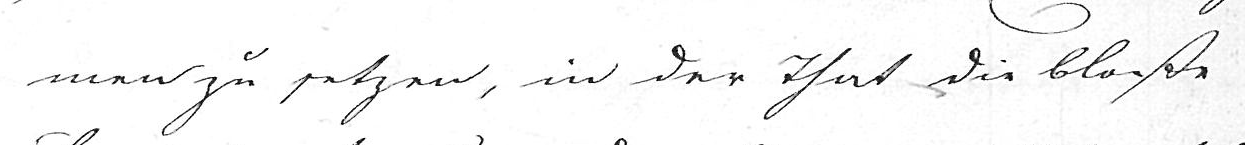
men zu setzen, in der That die bloße
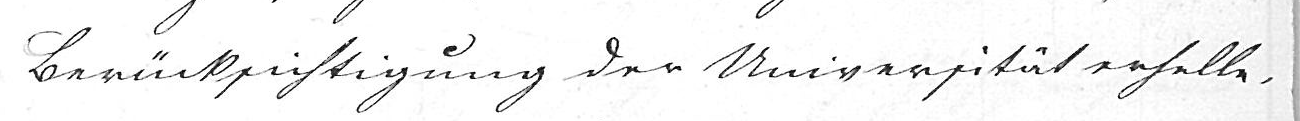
Berücksichtigung der Universität erhelle.
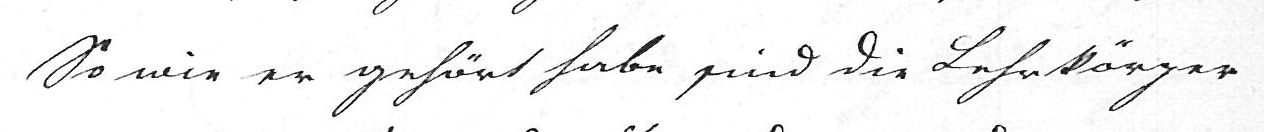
So wie er gehört habe sind die Lehrkörper
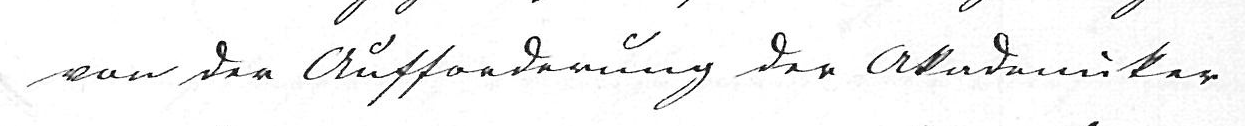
von der Aufforderung der Akademiker
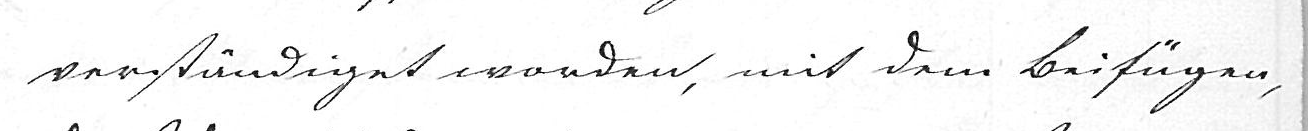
verständiget worden, mit dem Beifügen,
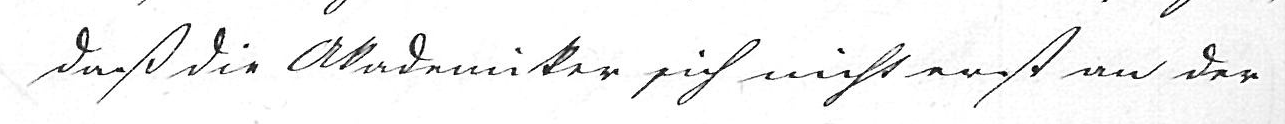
daß die Akademiker sich nicht erst an der
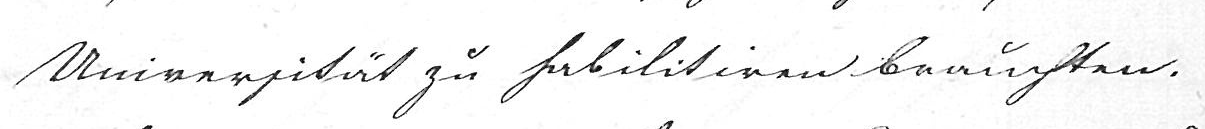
Universität zu habilitiren brauchten.
